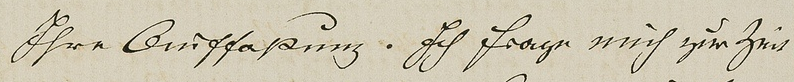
Ihre Auffaßung. Ich frage mich zur Zeit
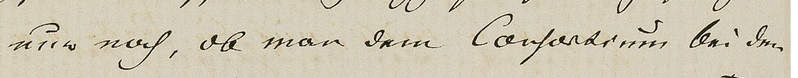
nur noch, ob man dem Consortium bei den
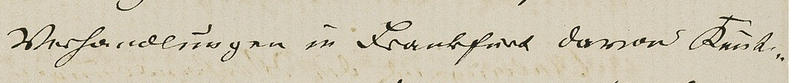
Verhandlungen in Frankfurt davon Kennt-
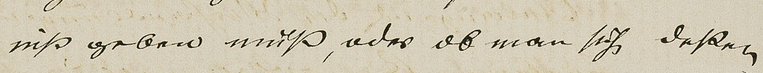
niß geben muß, oder ob man sich deßen
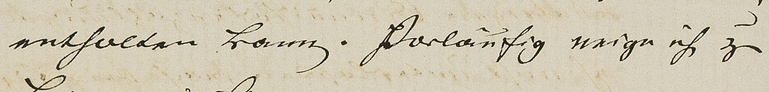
enthalten kann. Vorläufig neige ich zu
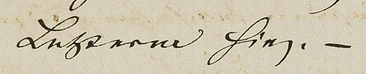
Letzterm hin. –
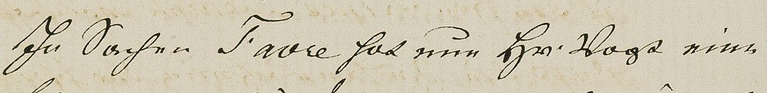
In Sachen Favre hat nun Hr. Vogt eine
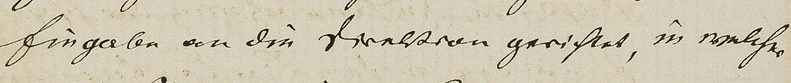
Eingabe an die Direktion gerichtet, in welcher
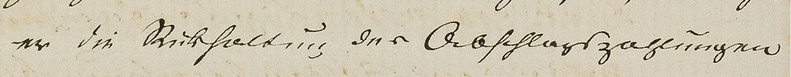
er die Rükhaltung der Abschlagszahlungen
